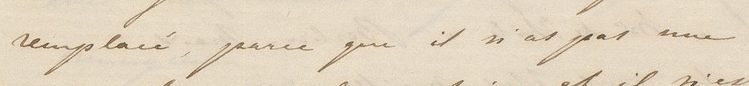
remplacé, parce que il n'as pas une
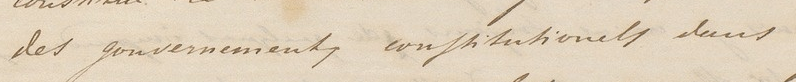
des gouvernements constitutionels dans
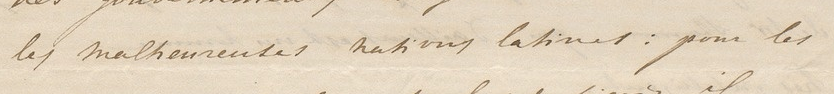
les malheureuses nations latines: pour les
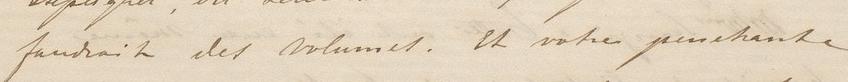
faudrait des volumes. Et votre penetrante
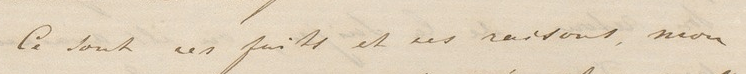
Ce sont ces faits et ces raisons, mon
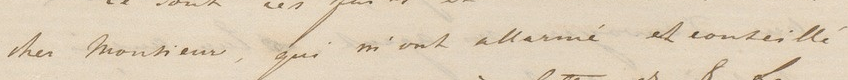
cher Monsieur, qui m'ont allarmé et conseillé
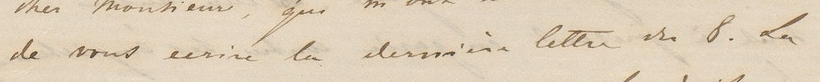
de vous ecrire la dernière lettre du 8. La
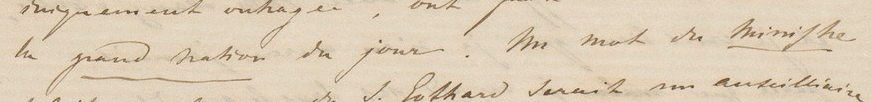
la grand nation du jour. Un mot du Ministre
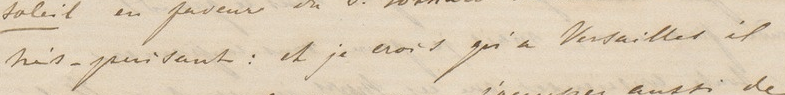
trés-puisant: et je crois qu'a Versailles il
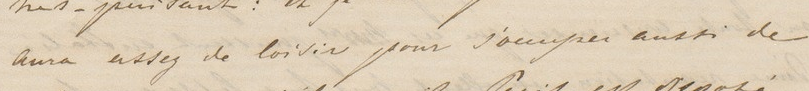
aura assez de loisir pour s'occuper aussi de
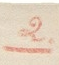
les
